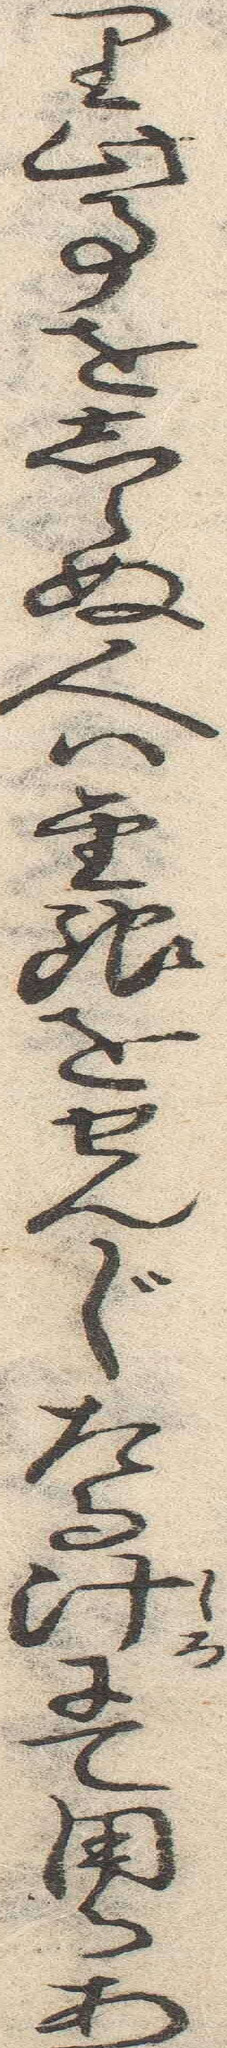り此事をしらぬ人は金銀をせんじたる汁にて用るあ
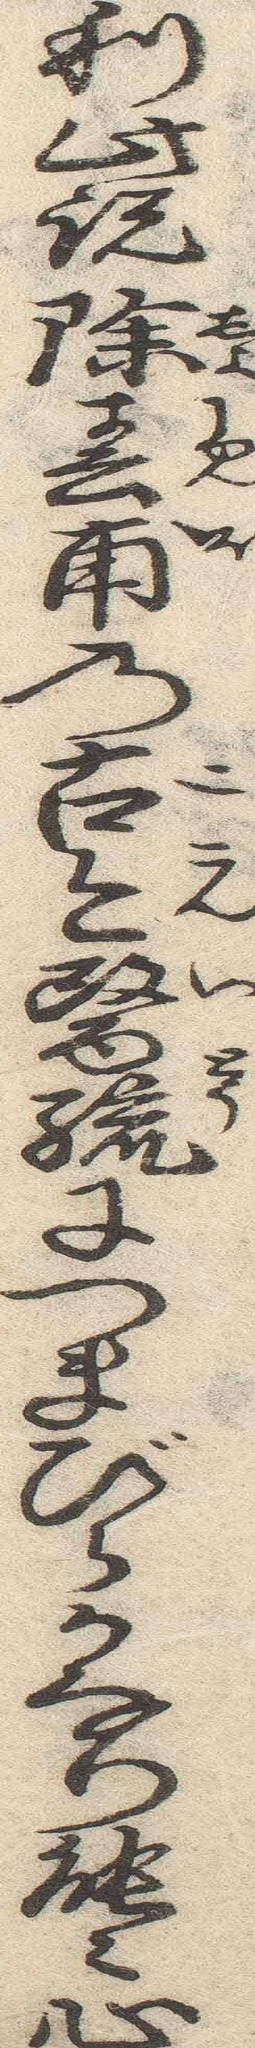り此説除春甫の古今医統につまびらかなり能々心
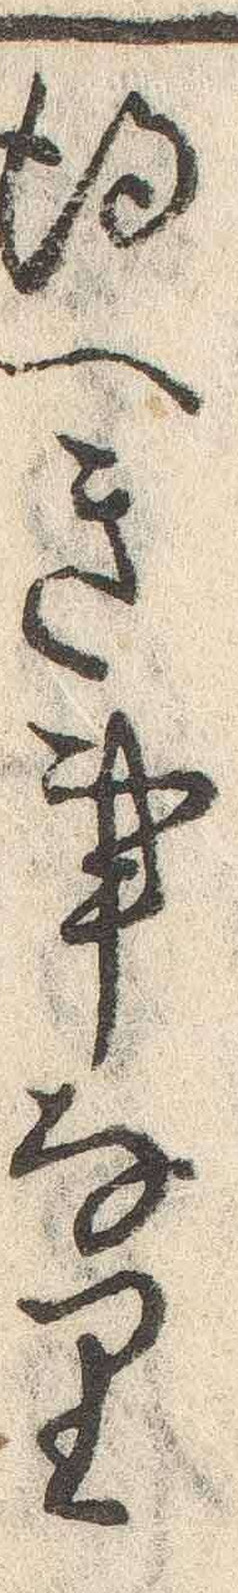得へき事なり
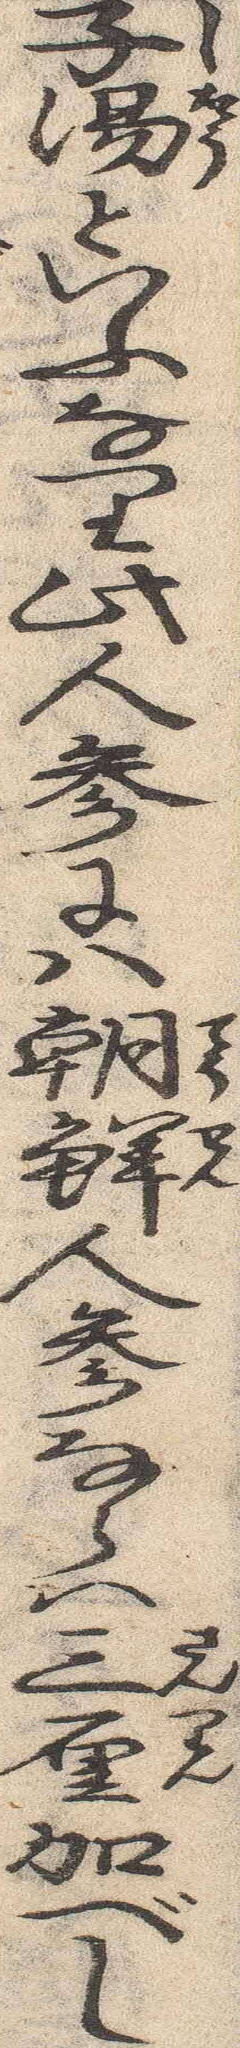子湯といふなり此人参には朝鮮人参ならは三厘加べし
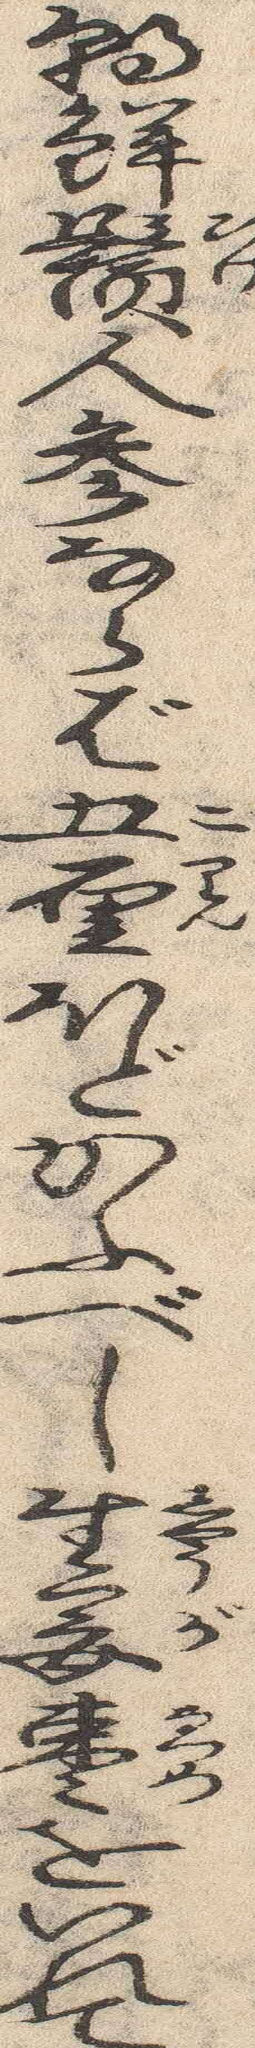朝鮮鬚人参ならば五厘ほど加ふべし生姜棗をいれて
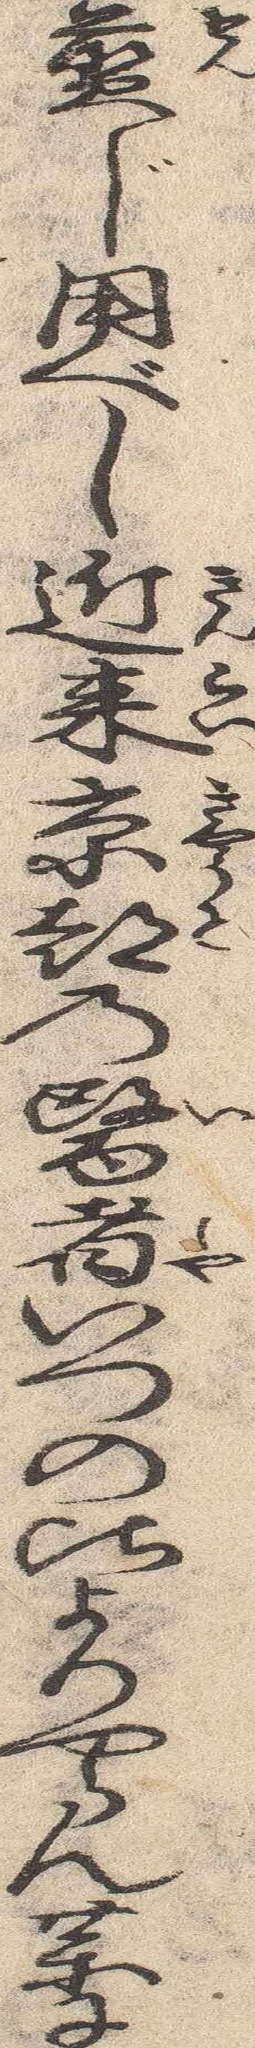煎じ用べし近来京都の医者いつの比よりやらん薬に
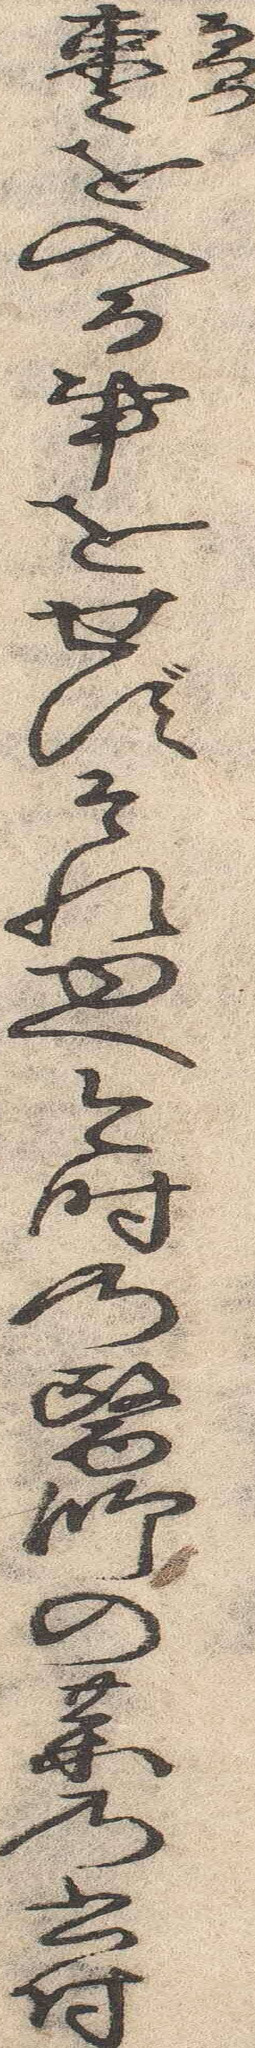棗を入る事をせずそれゆへ今時の医師の薬の書付
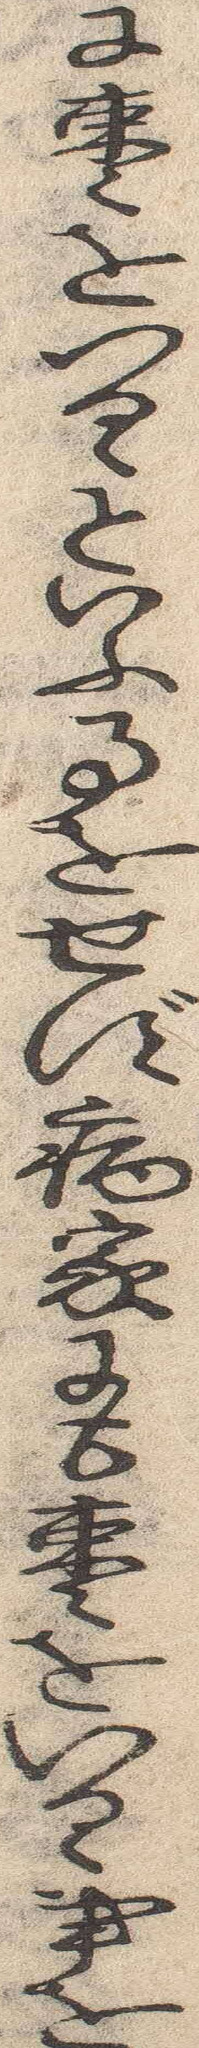に棗をいるゝといふ事をせず病家にも棗をいるゝ事を
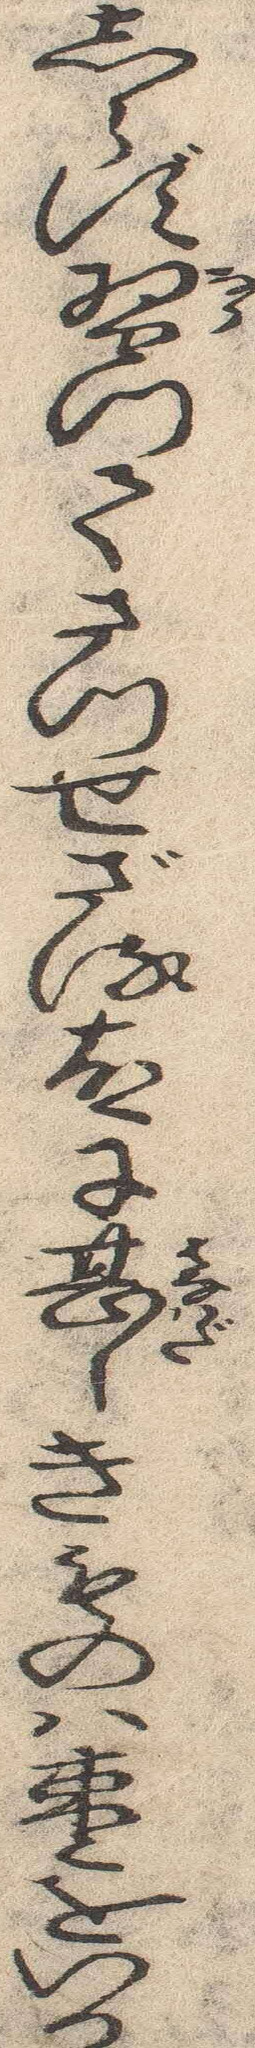しらず習つてさつせざる故に甚しきものは棗をいる
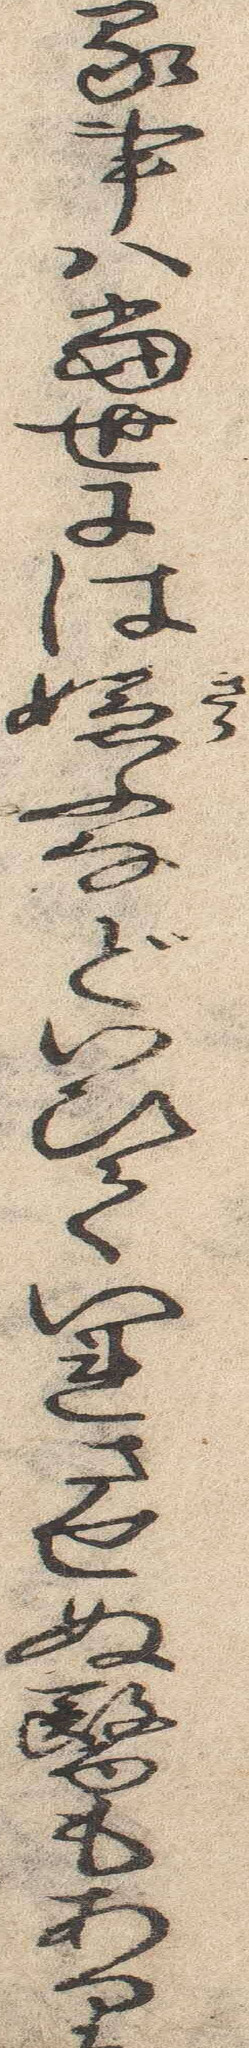る事は当世には嫌ふなどいひていれさせぬ医もあり
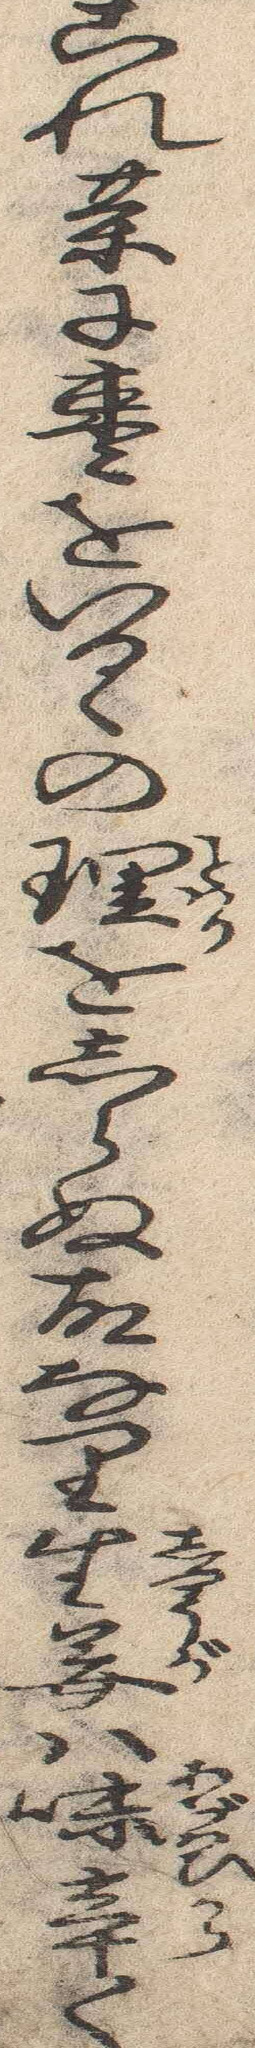これ薬に棗をいるゝの理をしらぬ故なり生姜は味辛く
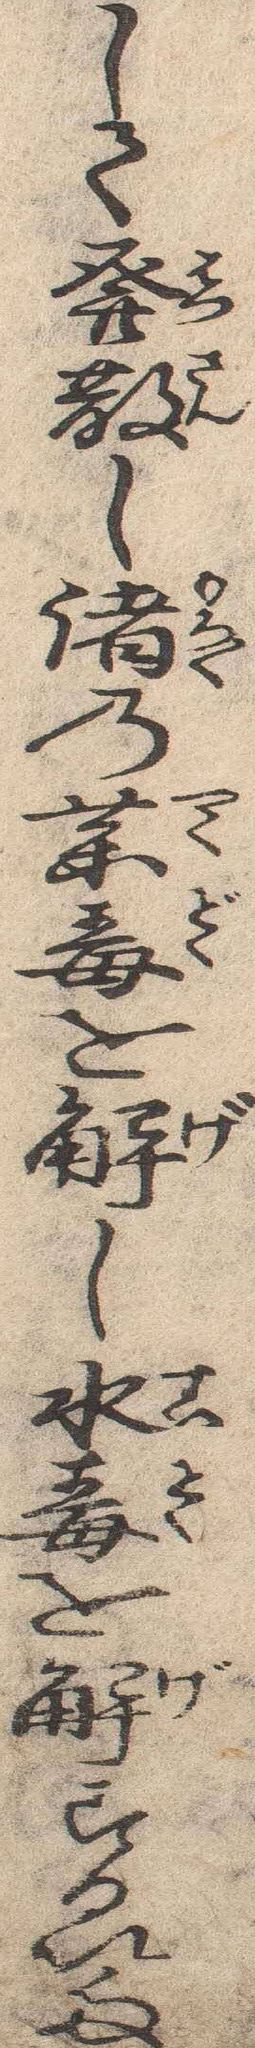して発散し諸の薬毒を解し水毒を解する以多
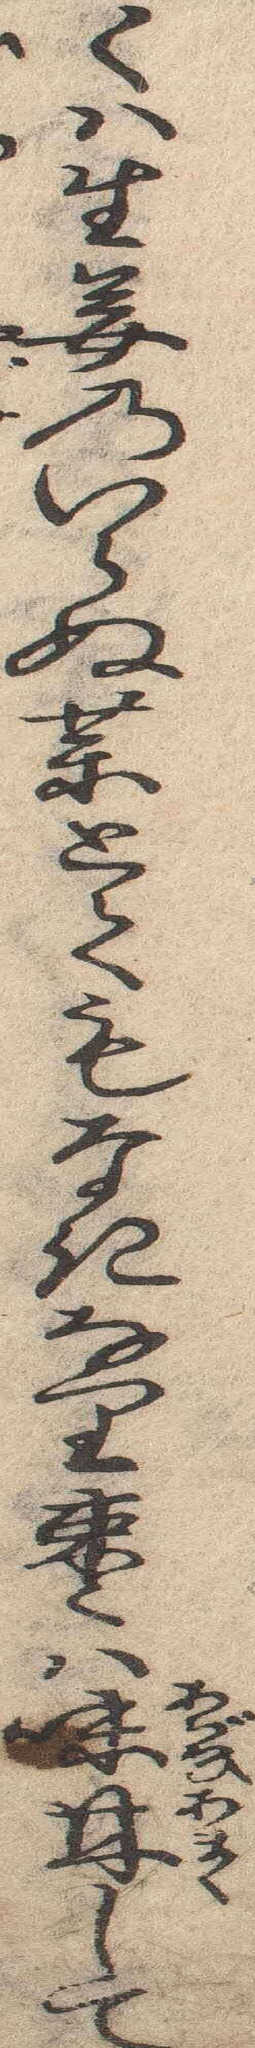くは生姜のいらぬ薬とてもなきなり棗は味甘して
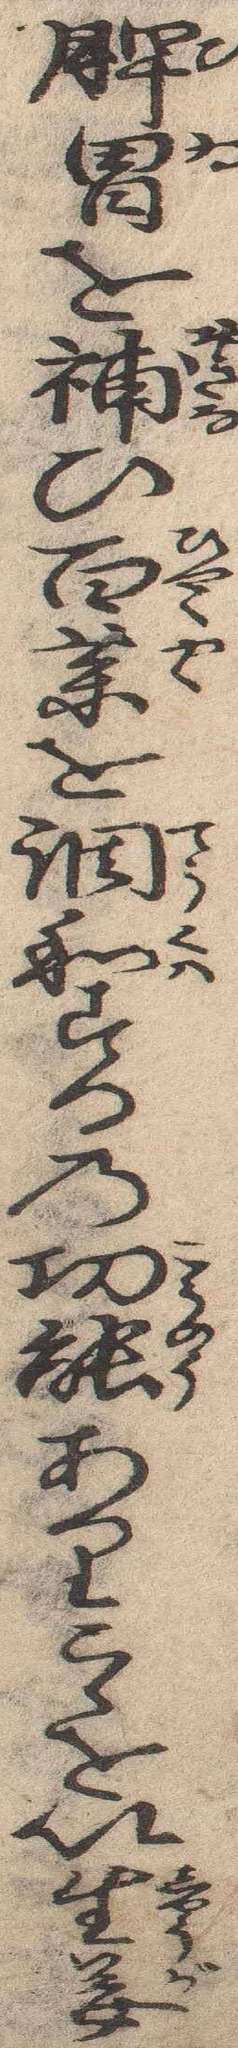脾胃を補ひ百薬を調和するの功能ありこゝを以生姜

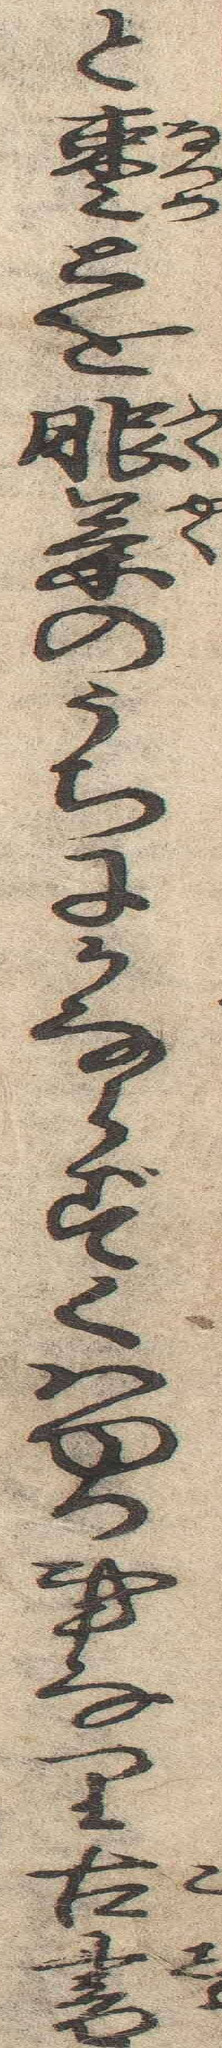と棗とを服薬のうちにかならずくはゆる事なり古書
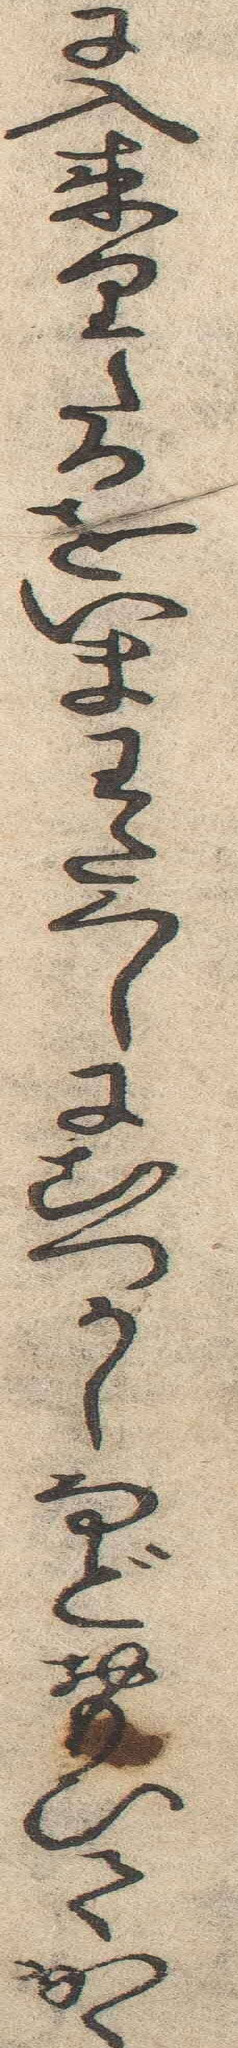に入来りたるをいまわたくしにむつかしなどおもひてかく
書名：小児必用養育草
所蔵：東京学芸大学附属図書館 国文学研究資料館
